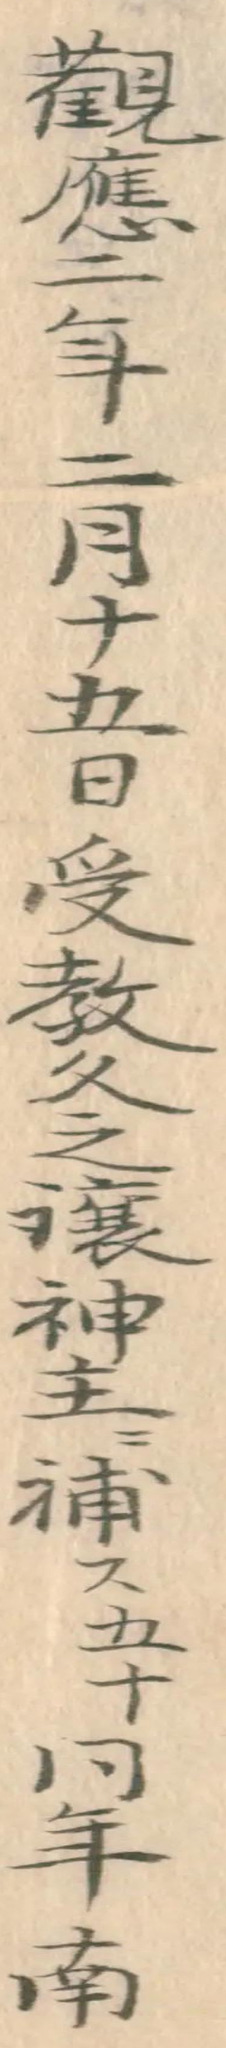久俊観応二年二月十五日受教久之譲神主ニ補ス五十同年南
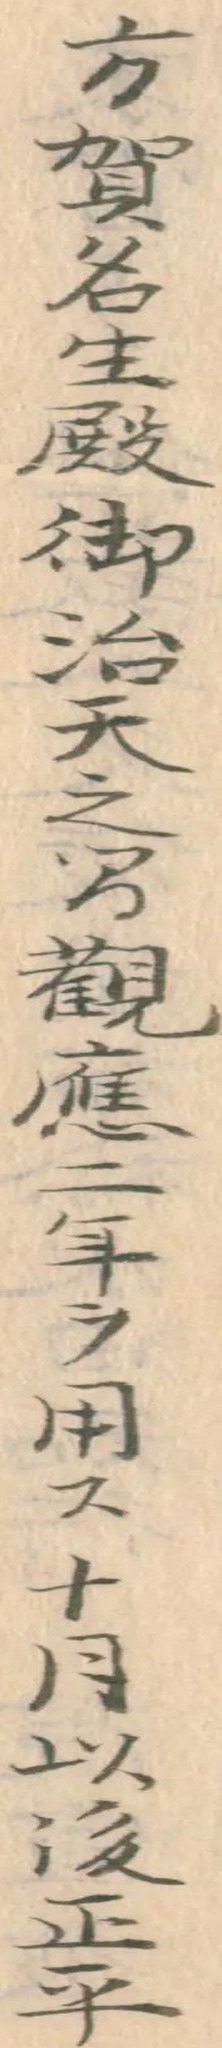方賀名生殿御治天之間観応二年ヲ用ス十月以後正平
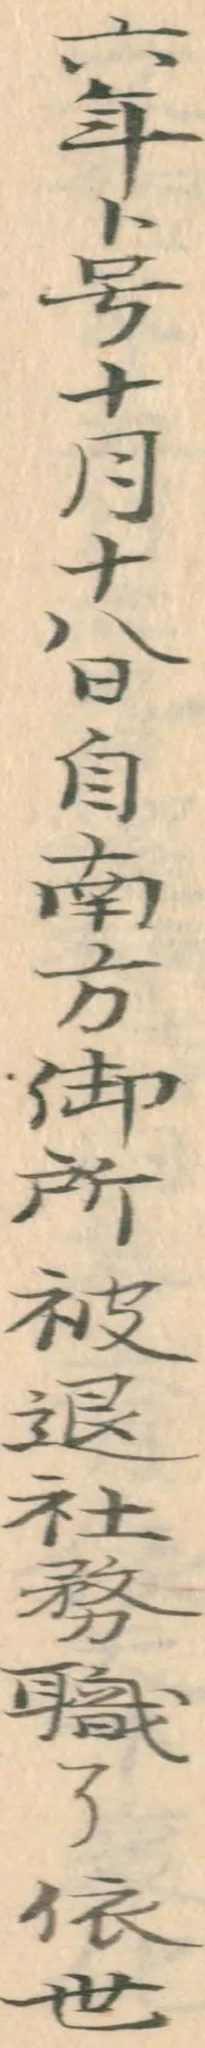六年ト号十月十八日自南方御所被退社務職了依世
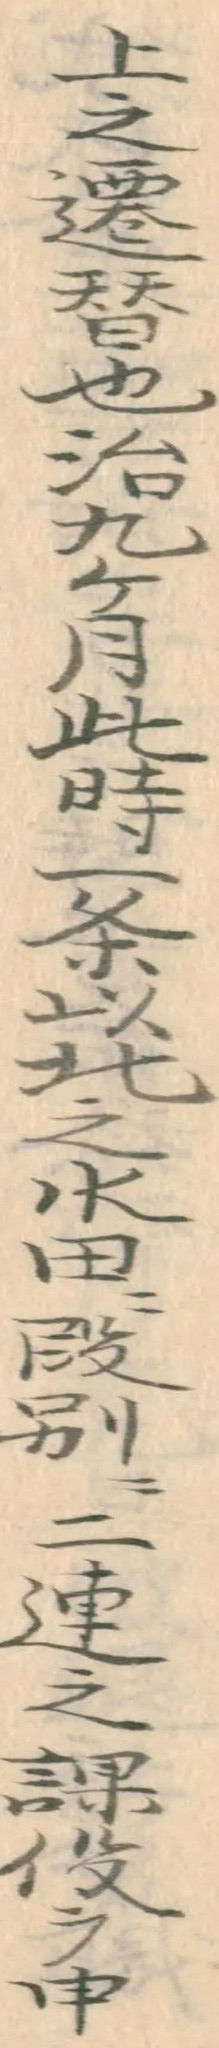上之遷替也治九ケ月此時一条以北之水田ニ段別ニ二連之課役ヲ申
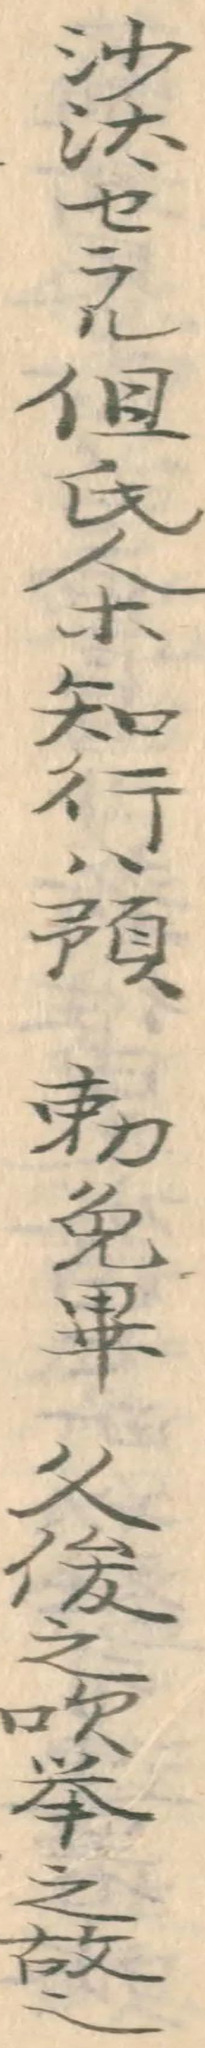沙汰セラル但氏人等知行ハ預勅免畢久俊之吹挙之故也
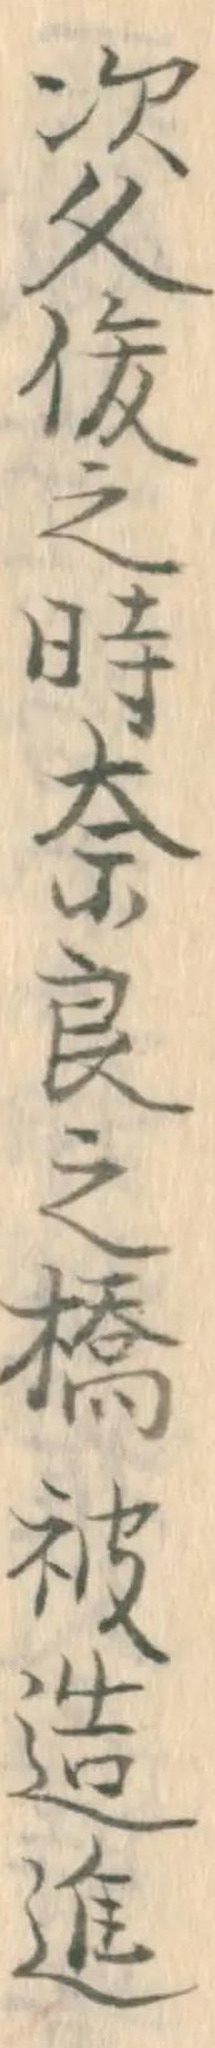次久俊之時奈良之橋被造進
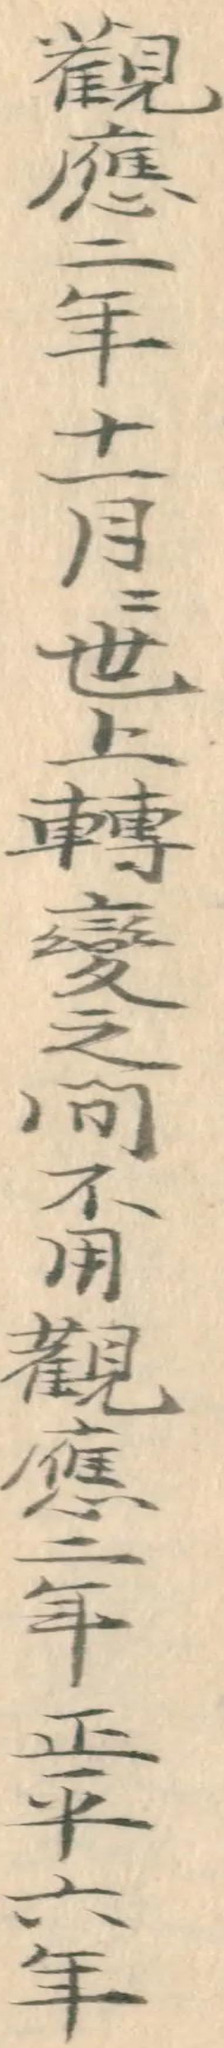還補観応二年十一月ニ世上転変之間不用観応二年正平六年
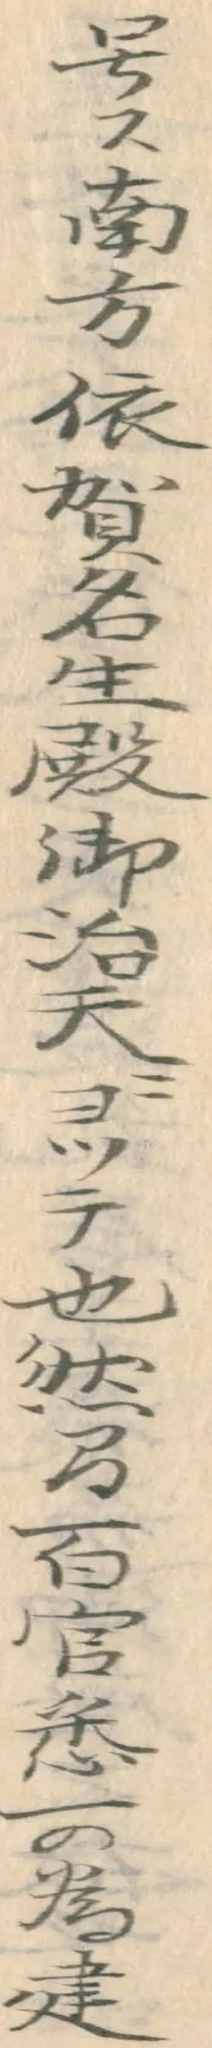号ス南方依賀名生殿御治天ニヨツテ也然間百官悉可為建
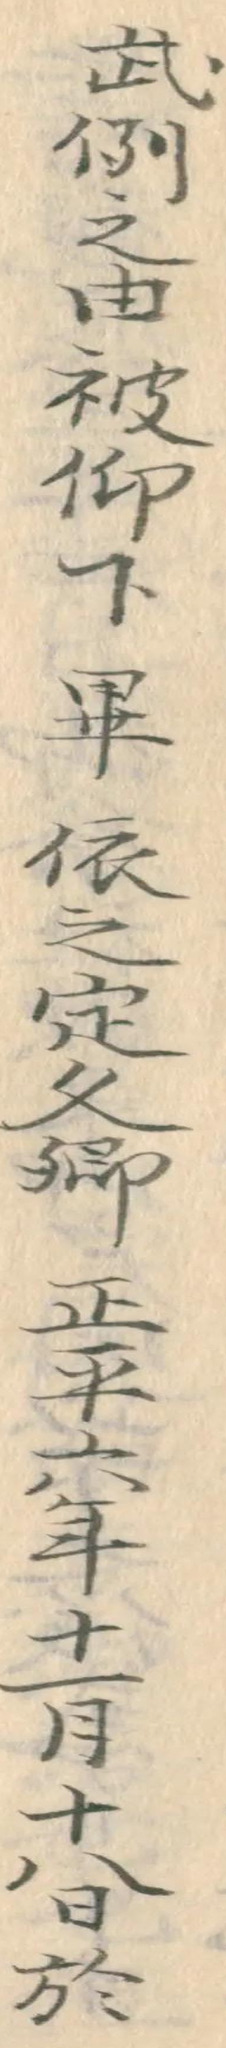武例之由被仰下畢依之定久卿正平六年十一月十八日於
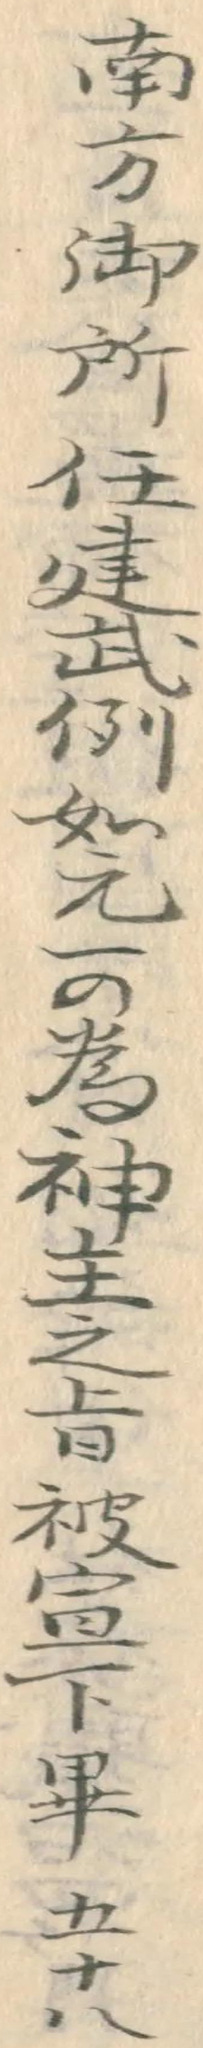南方御所任建武例如元可為神主之旨被宣下畢五十八
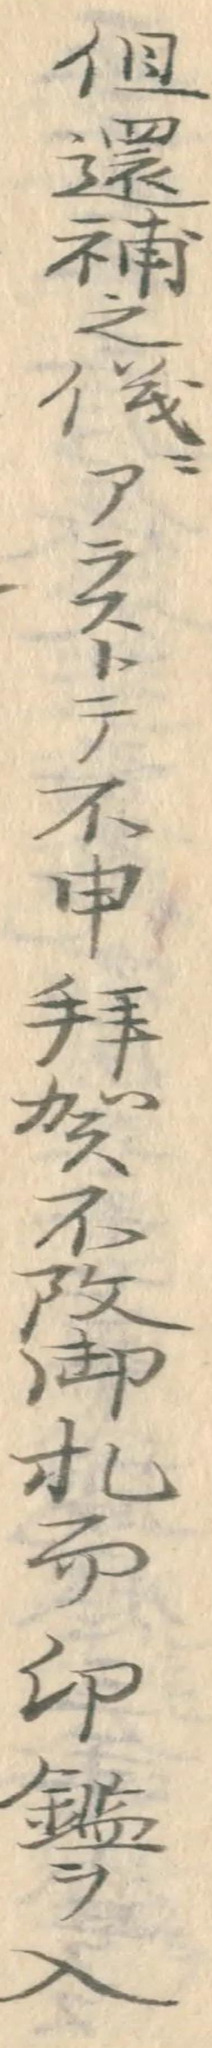但還補之儀ニアラストテ不申拝賀不改御札而印鑑ヲ入
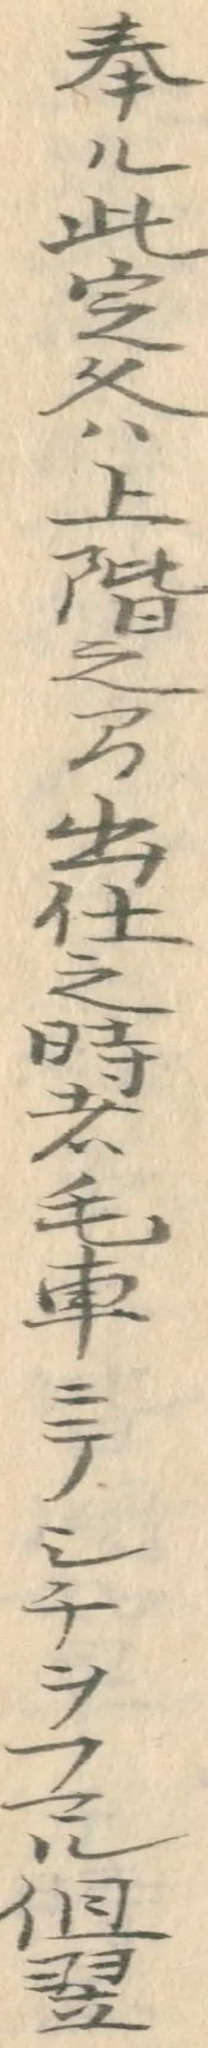奉ル此定久ハ上階之間出仕之時者毛車ニテシチヲフマル但翌
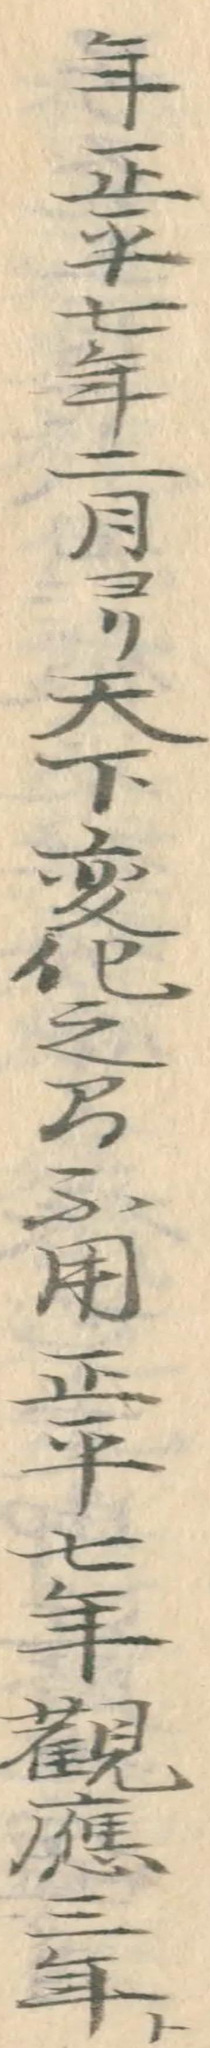年正平七年二月ヨリ天下変化之間不用正平七年観応三年ト

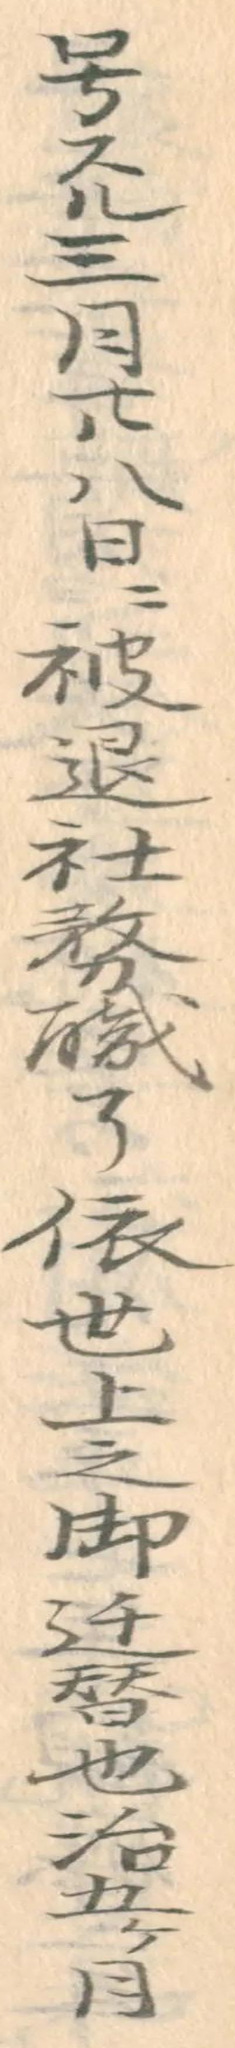号スル三月廿八日ニ被退社務職了依世上之御遷替也治五ケ月
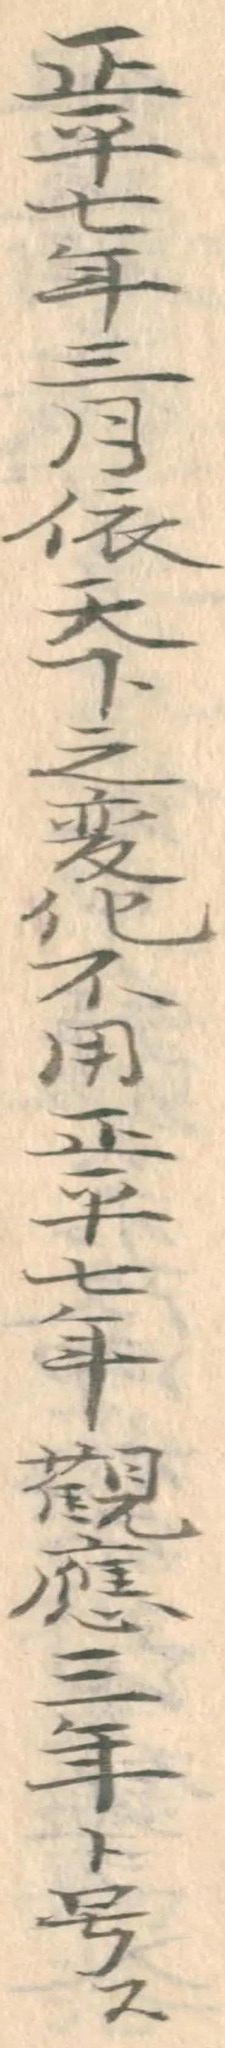正平七年三月依天下之変化不用正平七年観応三年ト号ス
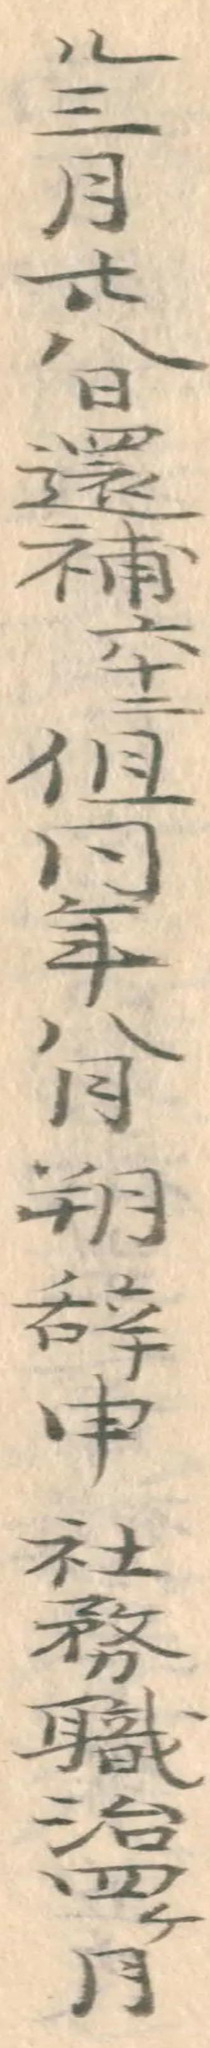ル三月廿八日還補六十二但同年八月朔辞申社務職治四ケ月
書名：賀茂社記録. 第24冊
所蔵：国立国会図書館 National Diet Library, JAPAN
